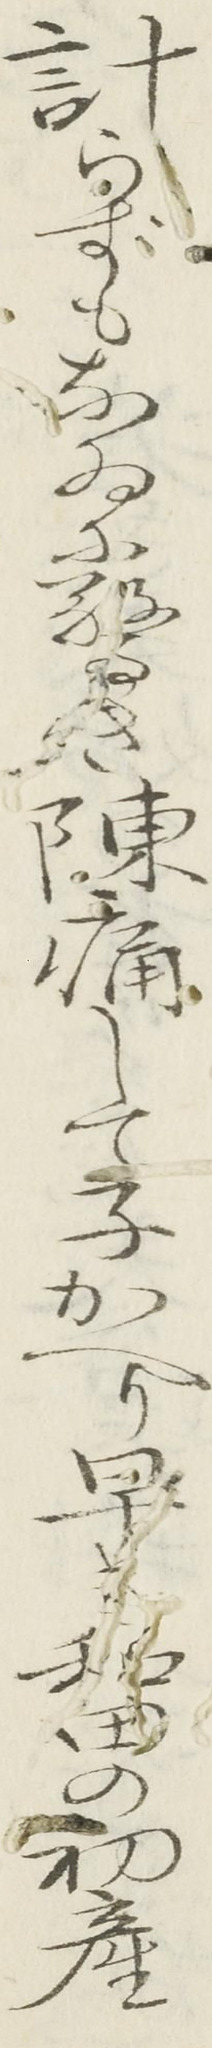計らずもなゐに驚き陣痛シキリして子かへり早和田の初産
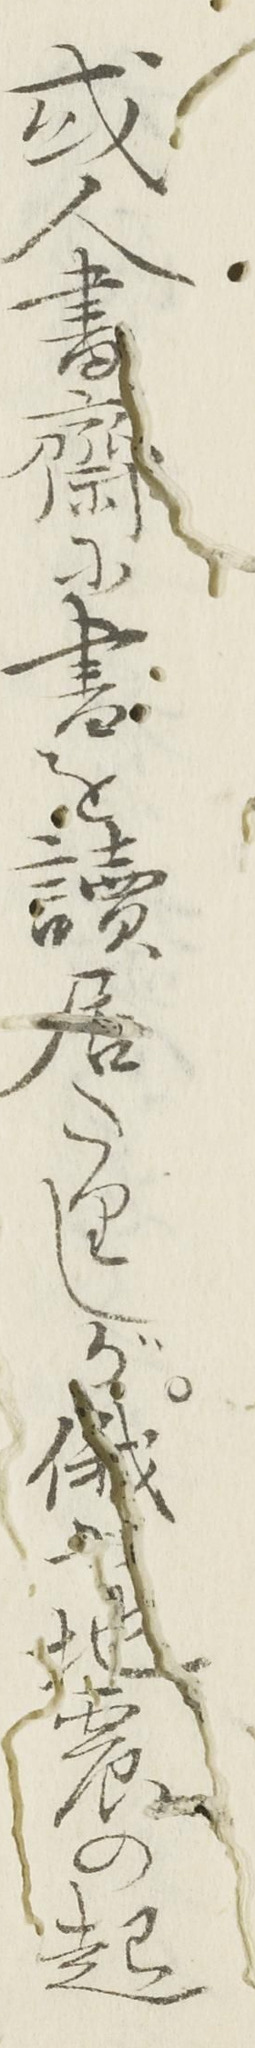或人書斎に書を読居たりしが俄に地震の起
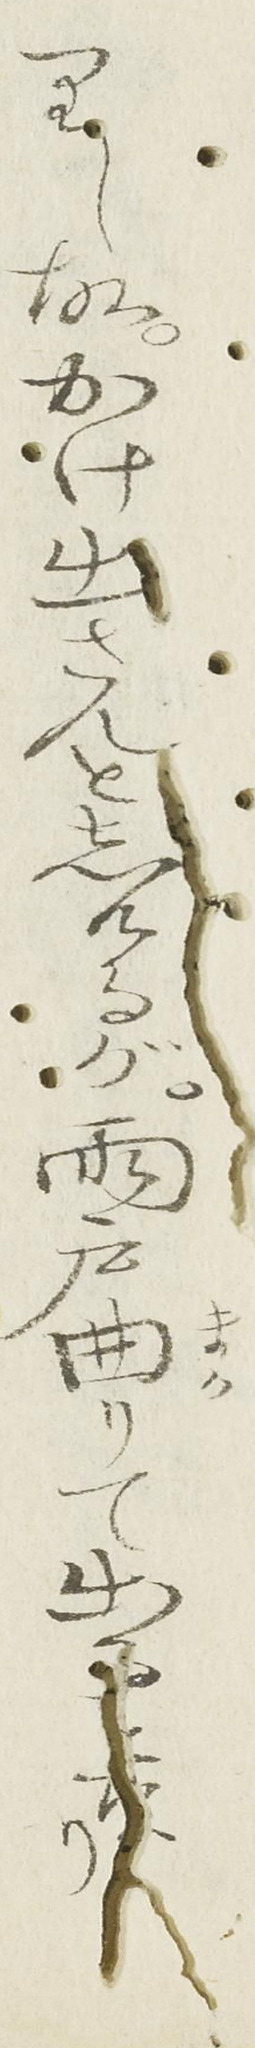りし故かけ出さんとしけるが雨戸曲まがりて出るり
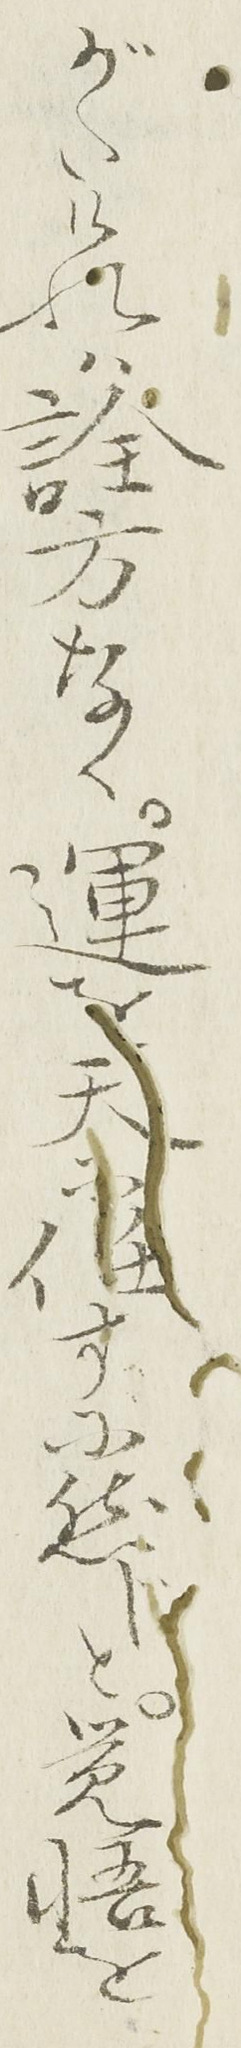がたけれハ詮方なく運を天に任すに然しと覚悟を
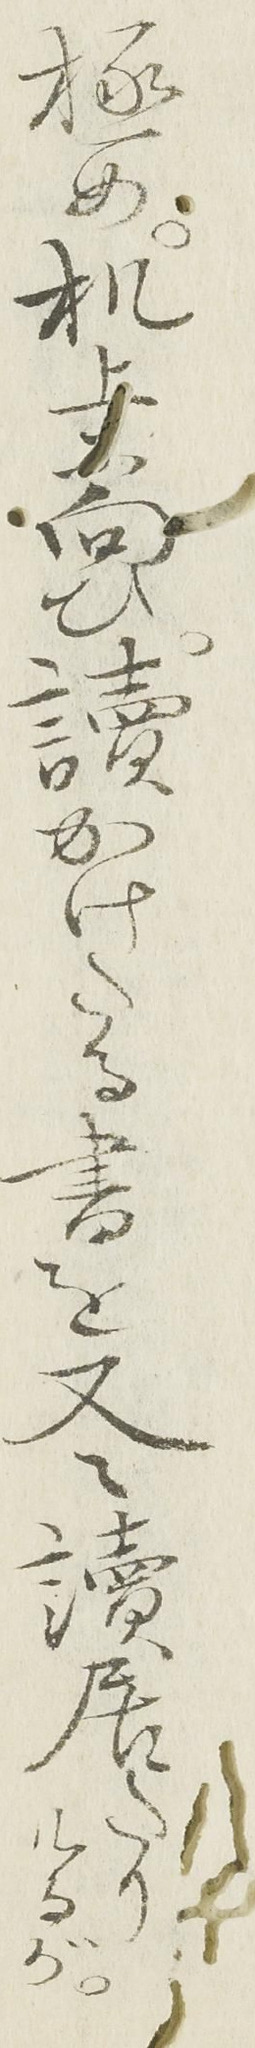極め机上に向ひ読かけたる書を又々読居たりけるが
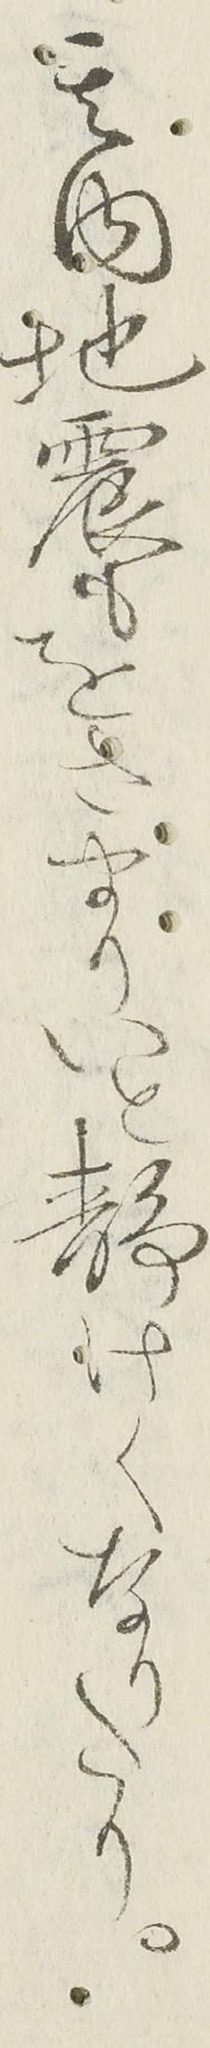其内地震もをさまりいと静けくなりたり
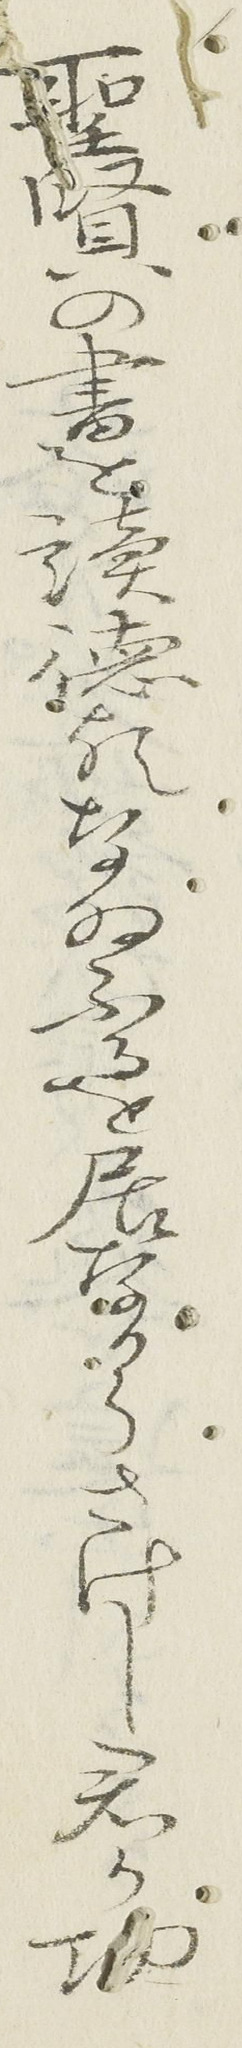聖賢の書を読徳歟なゐふるを居なからさけし君か功
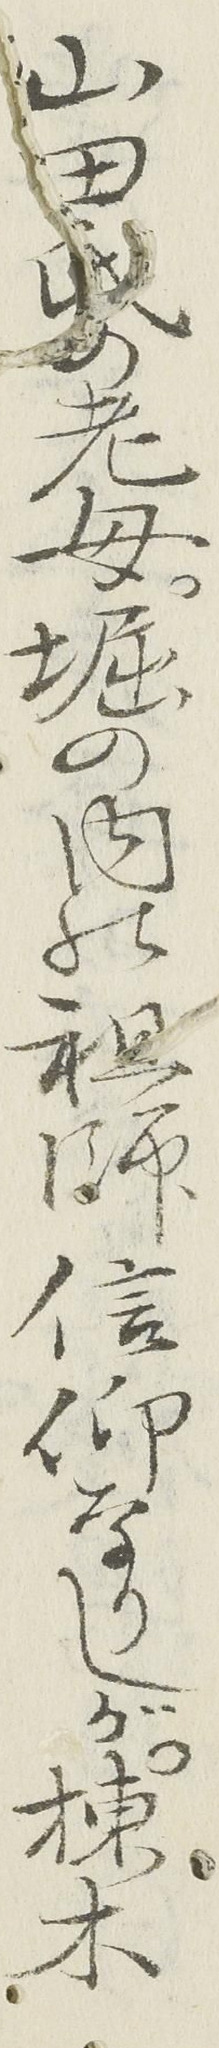山田氏の老母堀の内の祖師信仰なりしが棟木
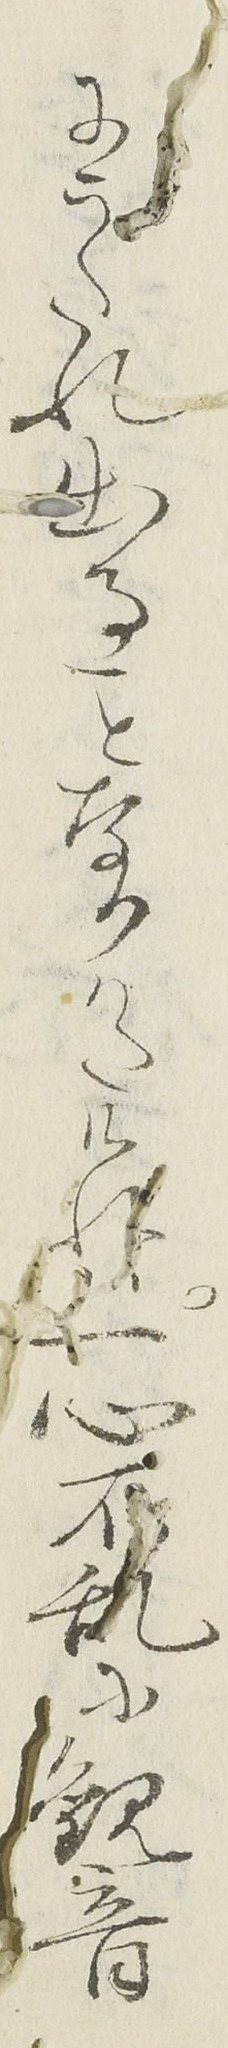にうたれ出ることなりかたけれハ一心不乱に観音

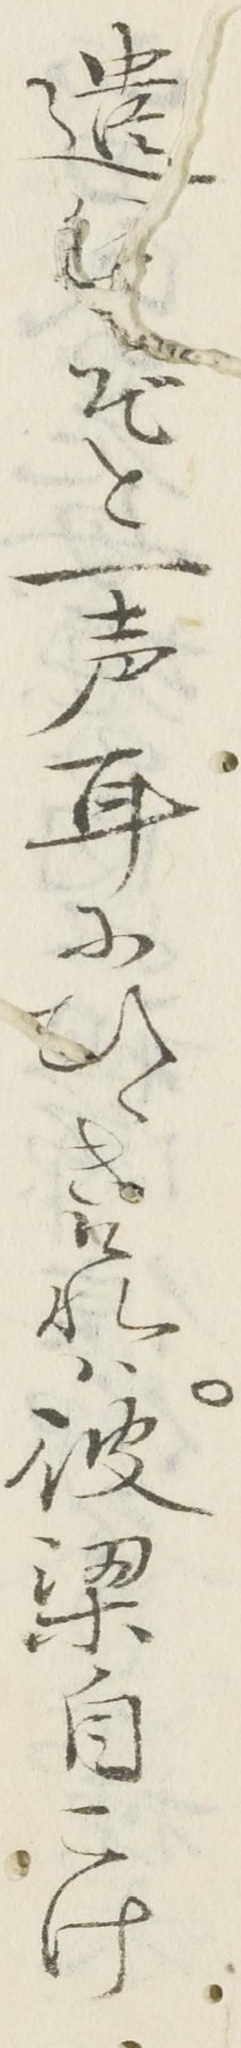遣わすぞと一声耳にひゝきけれハ彼梁自こけ
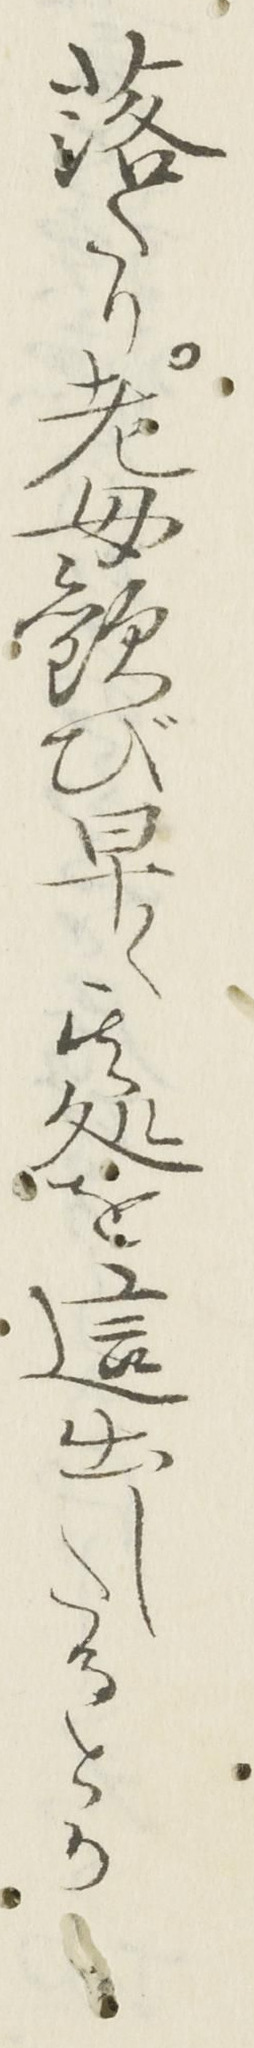落たり老母歓び早々其処を這出したるとか
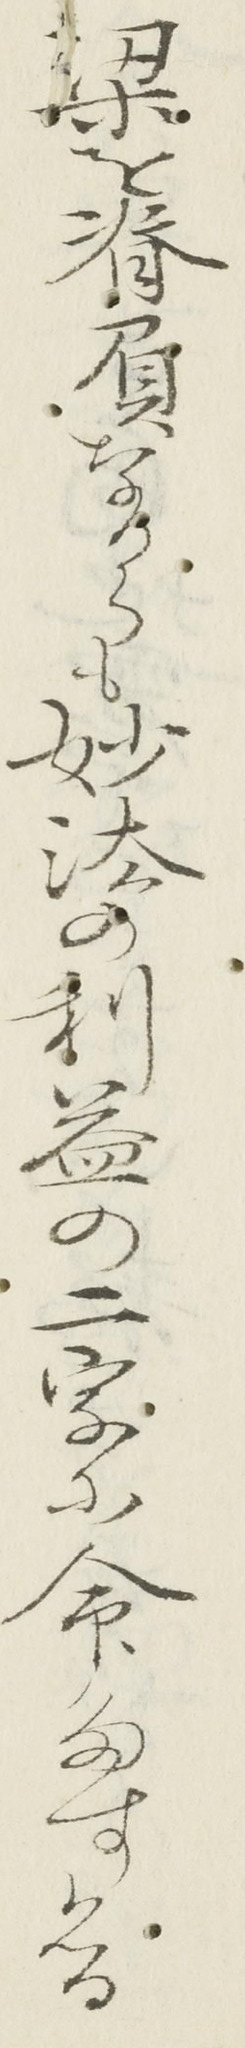梁を背負ながらも妙法の利益の二字に命たすける
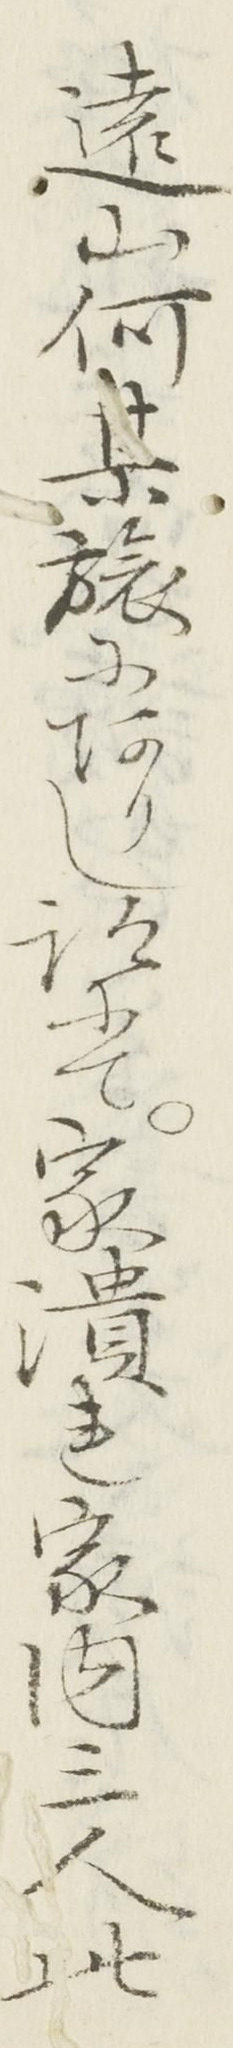遠山何某旅にありし話にて家潰れ家内三人此
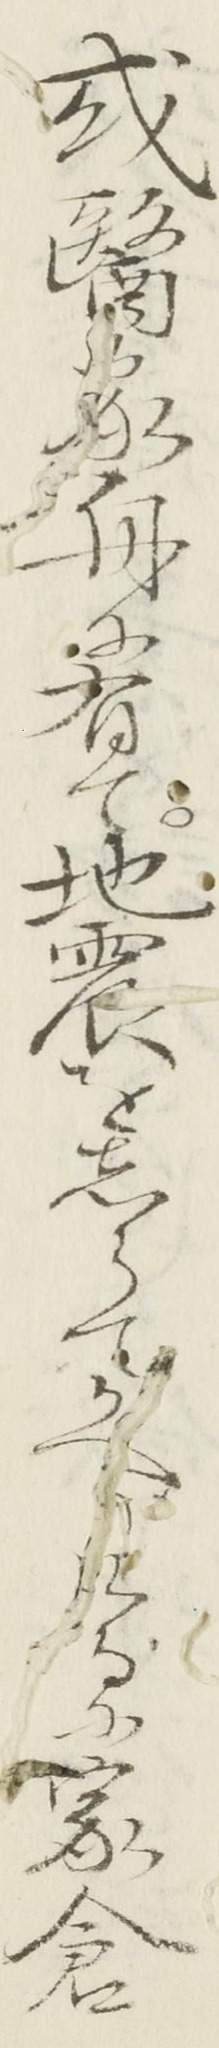或医家舟に有て地震をしらてかへるに家倉
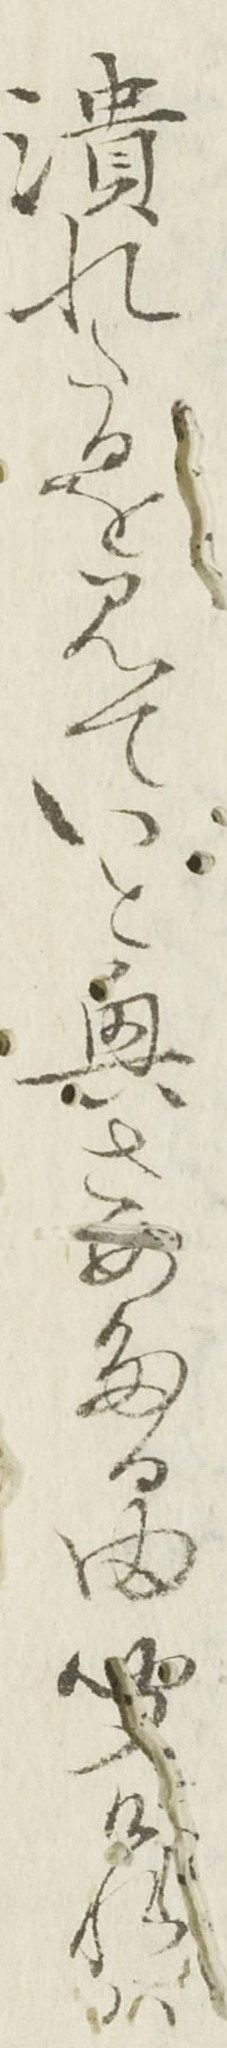潰れるを見ていと興さめたる由聞けれハ
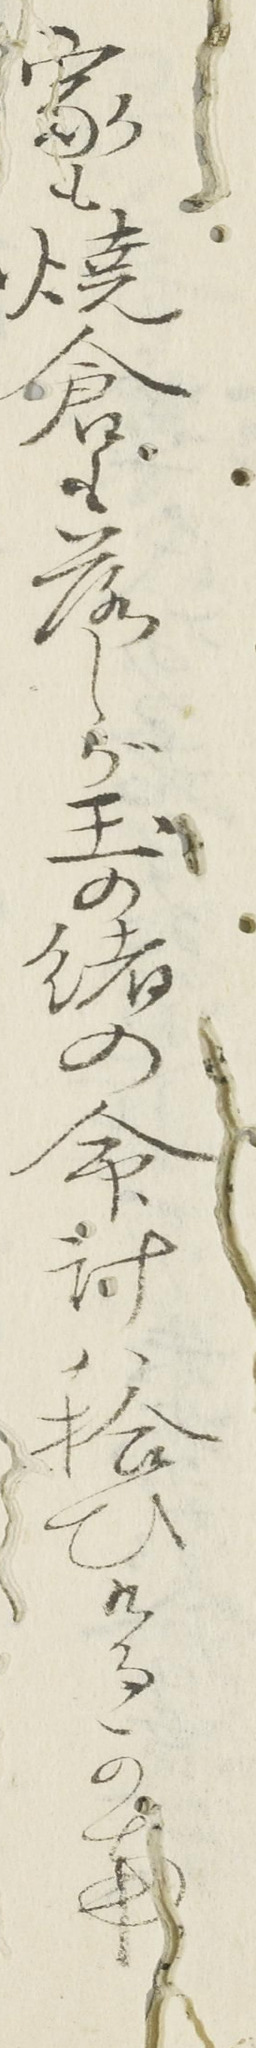家も焼倉も落しが玉の緒の命計ハ拾ひけるか南
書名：地震考證　全
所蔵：東京大学地震研究所図書室 Earthquake Research Institute Library, The University of Tokyo, JAPAN
